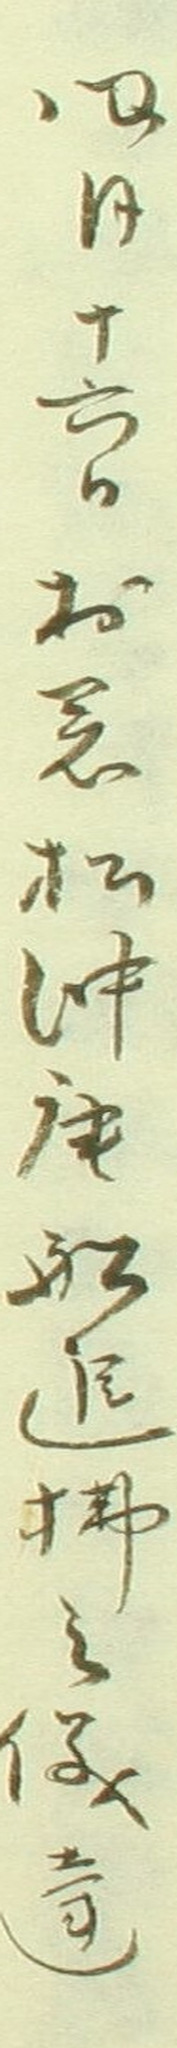四月十六日於若松沖唐船追払之儀違
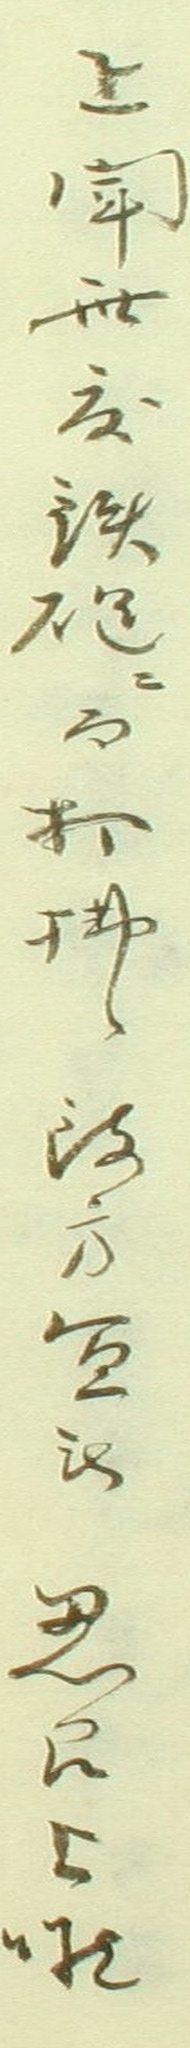被聞此度鉄砲に而打払候致方宜被思召被？
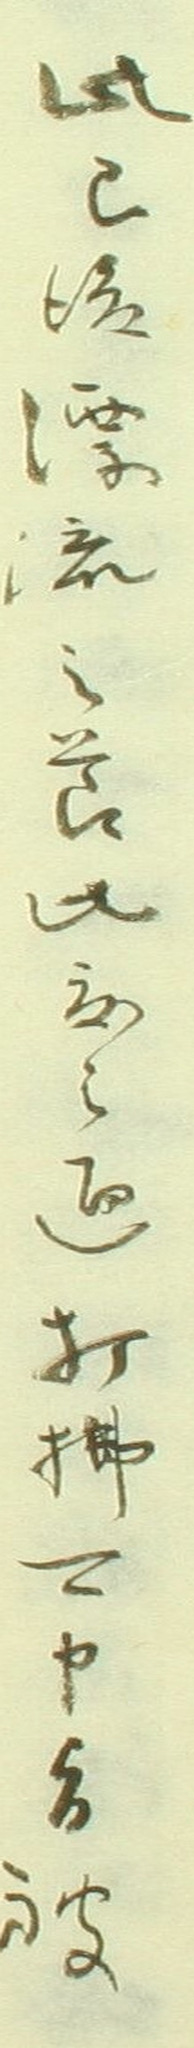此己後漂流之節此度之通打払可申旨被
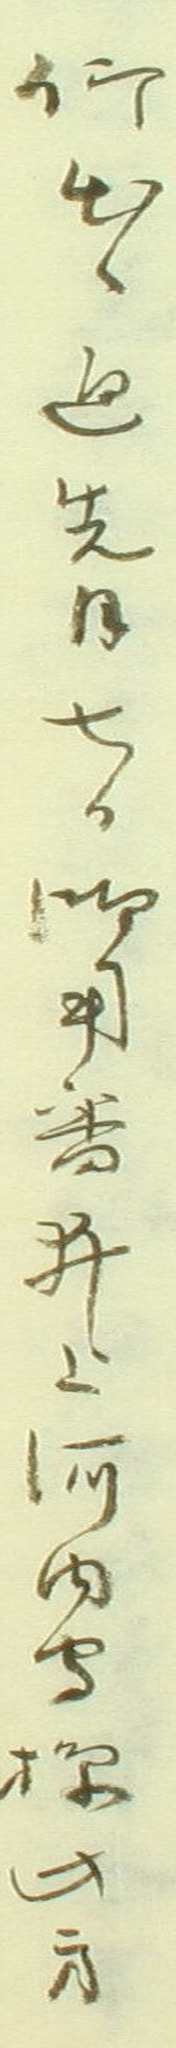仰出候通先月七日御用番井上河内守様此方
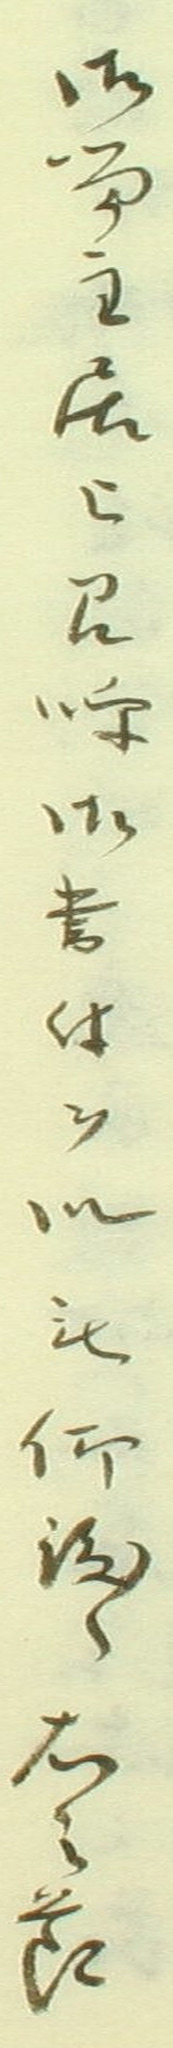御留主居被召呼御書付を以被仰渡之節
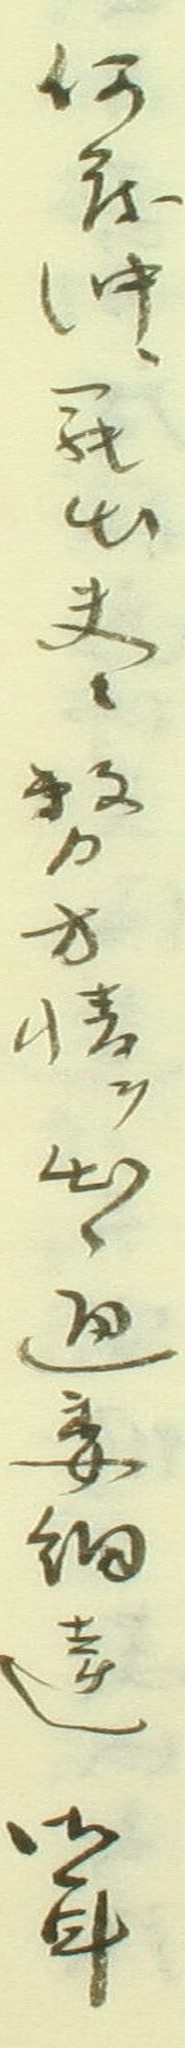何府沖へ罷出夫に勢方情を出候通委細違御耳
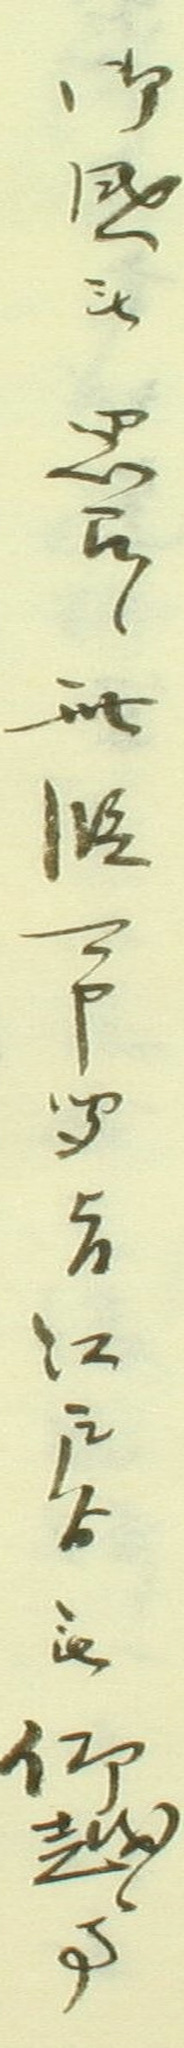御？被思召候此段可申聞旨江戸ゟ被仰越候事
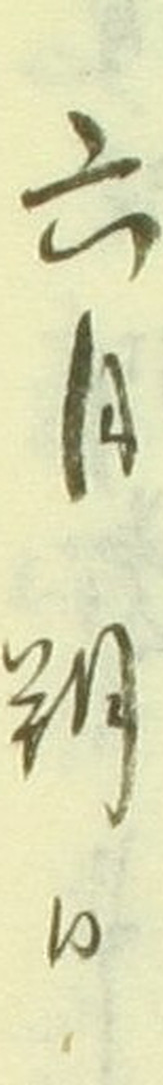六月朔日
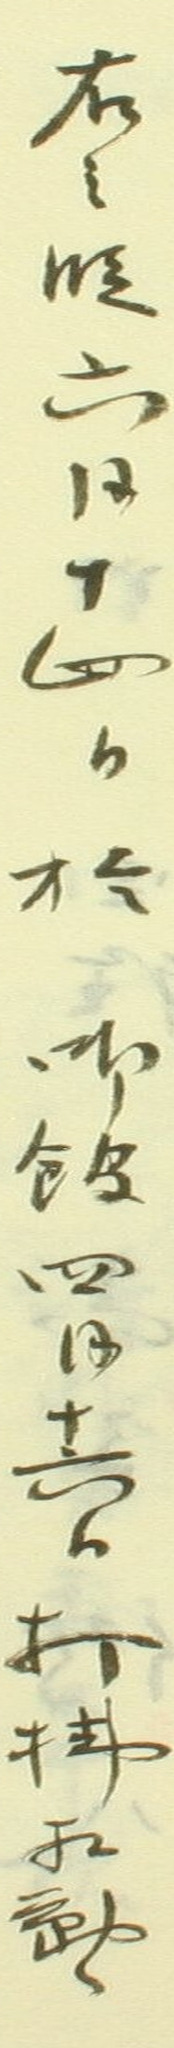右之段六月十四日於御飯四月十六日打払相動候
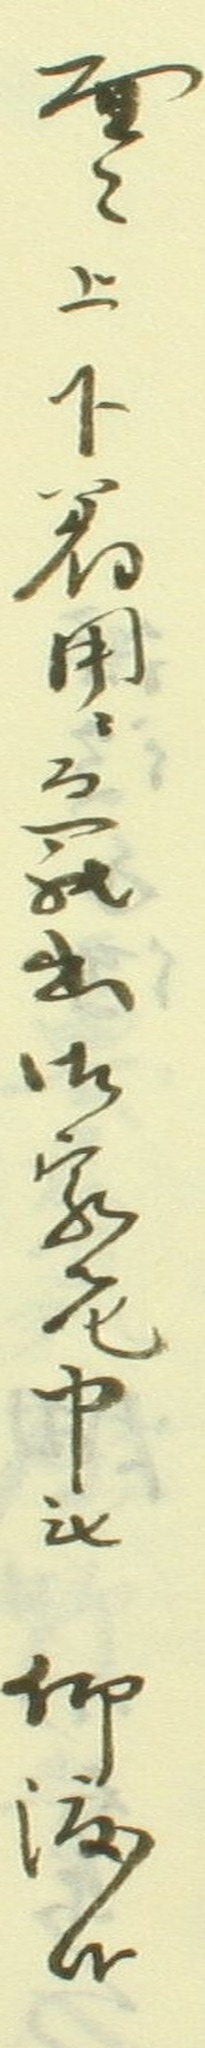面々上下着用に而罷出御家老中被仰渡候
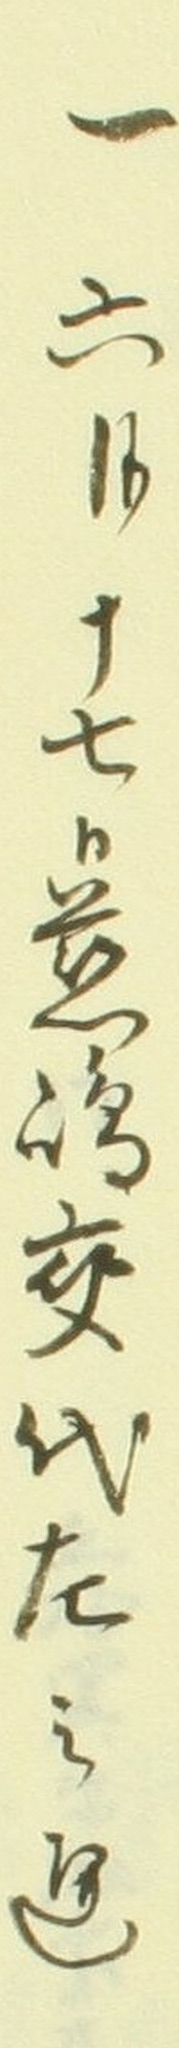一六月十七日慈嶋交代左之通
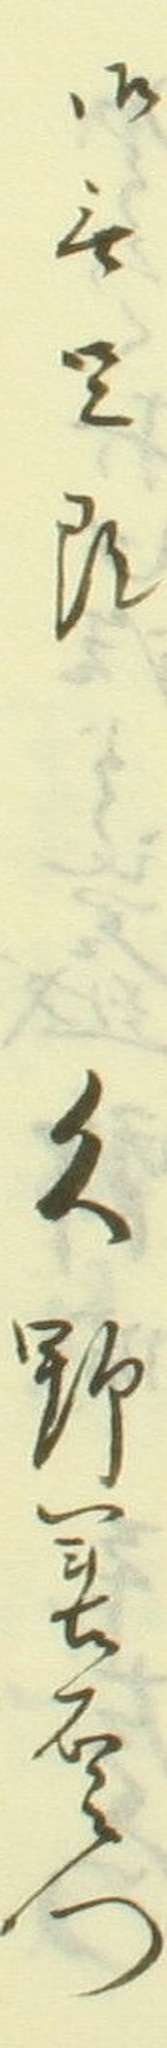御？足頭久野関右衛門
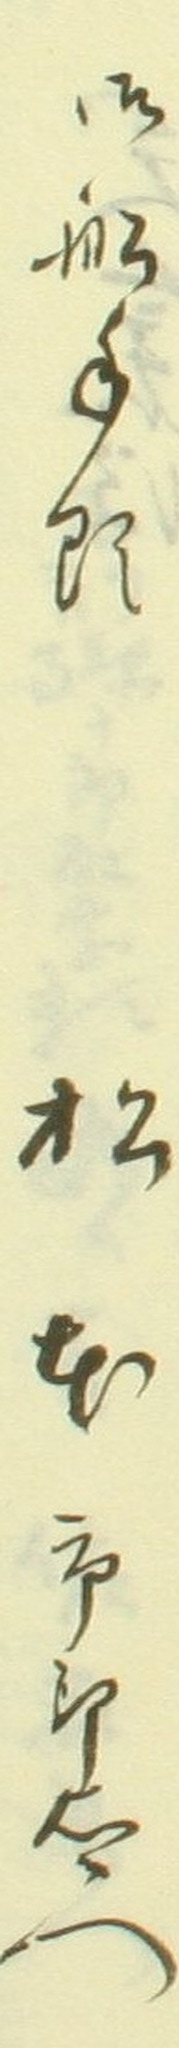御船手頭松本市郎右衛門
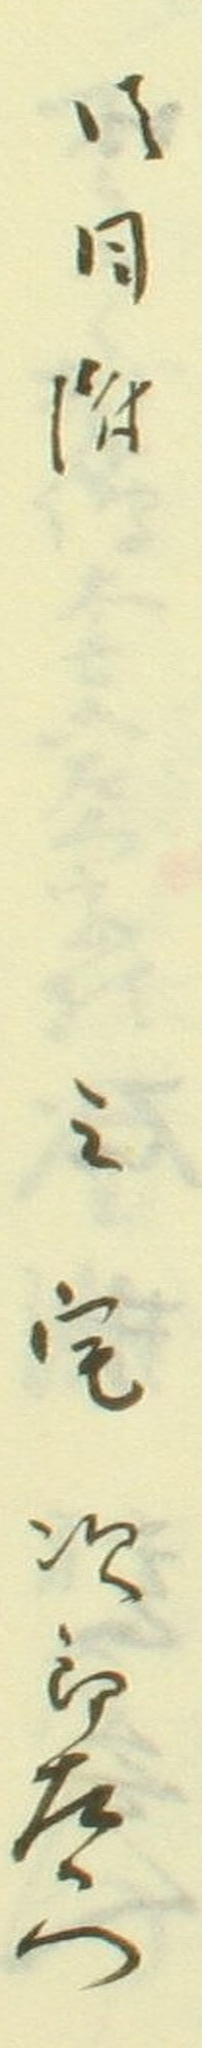御目附三宅次朗左衛門
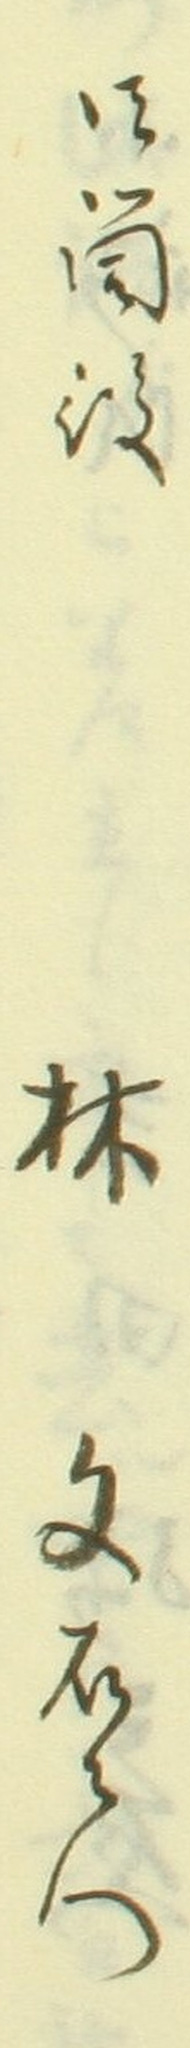御筒役林文右衛門
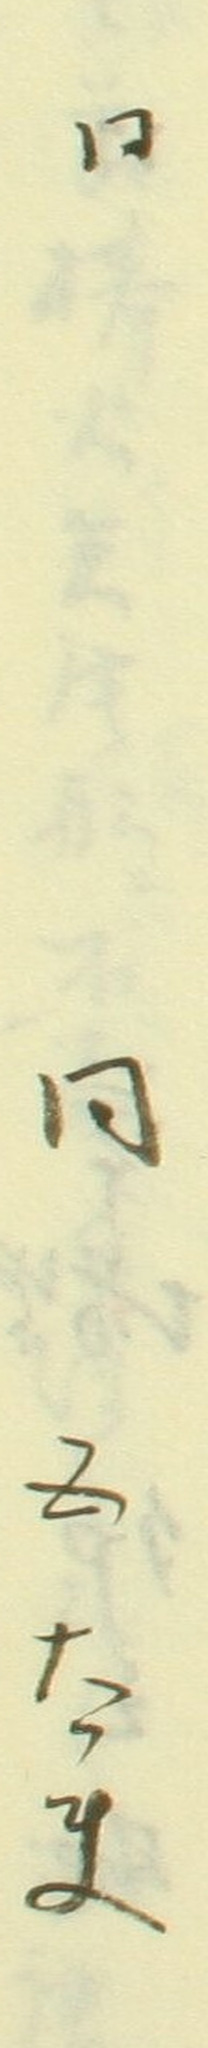同同五太夫
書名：唐船漂流記 三
